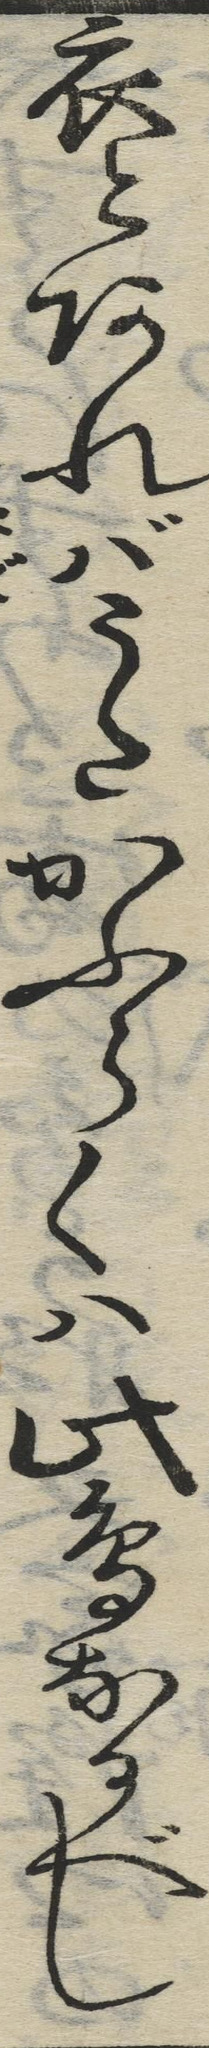衣とあれバうたかふらくハ此鳥なるべし
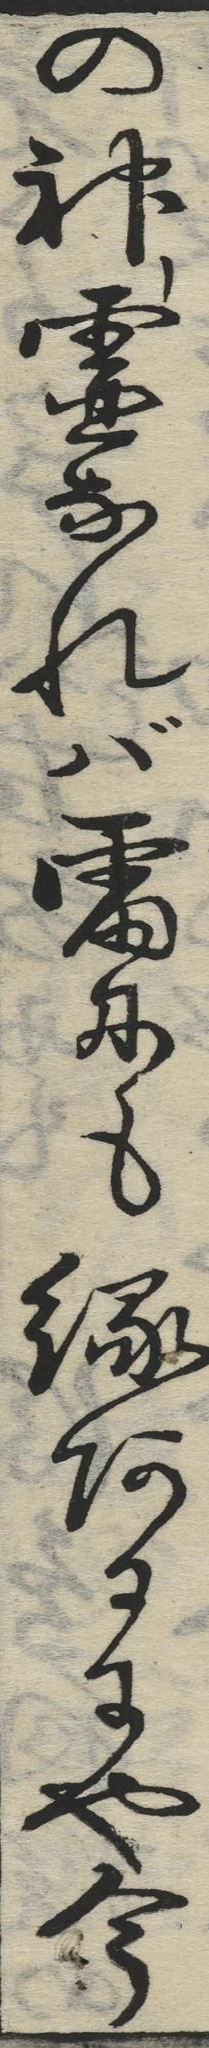の神ノ霊なれバ雷にも縁あるにや今
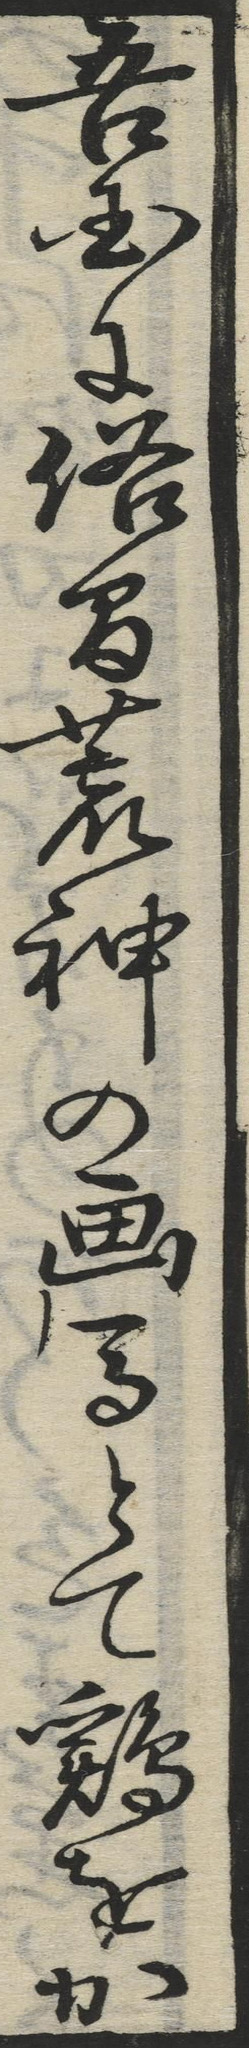吾国に俗間荒神の画馬とて鶏をか
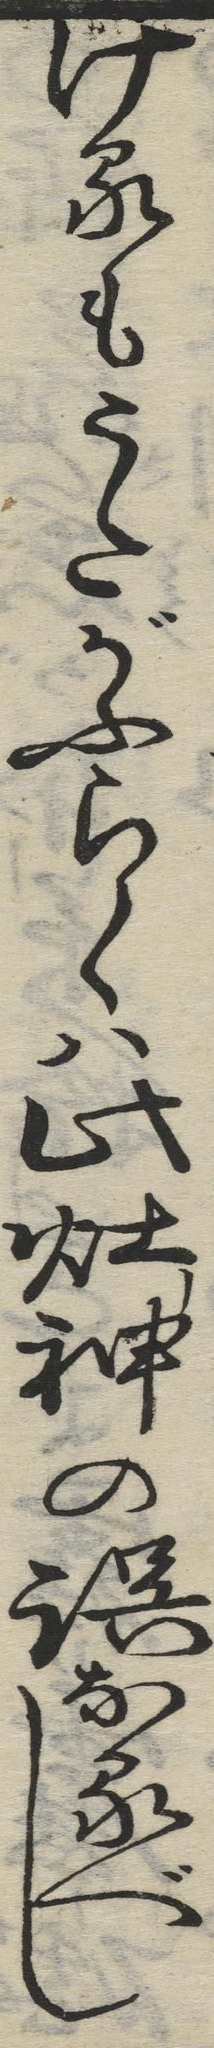けるもうたがふらくハ此灶神の誤なるべし
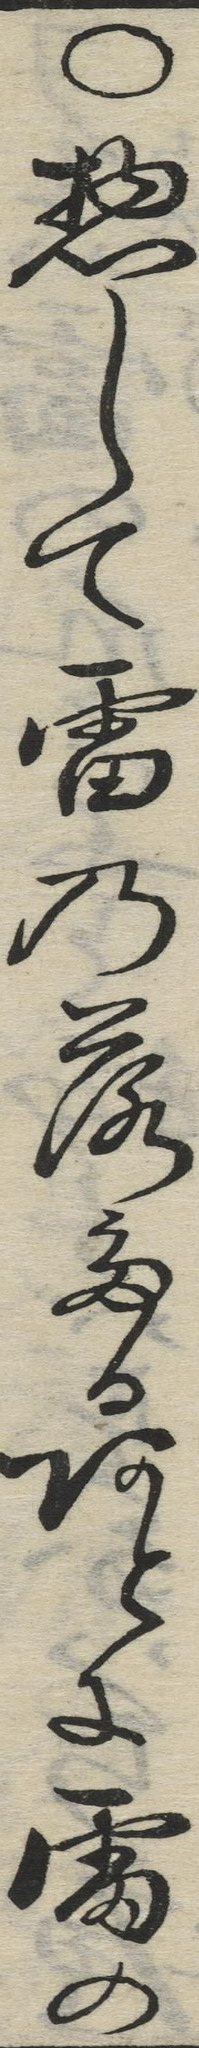〇惣して雷の落たるあとに雷の
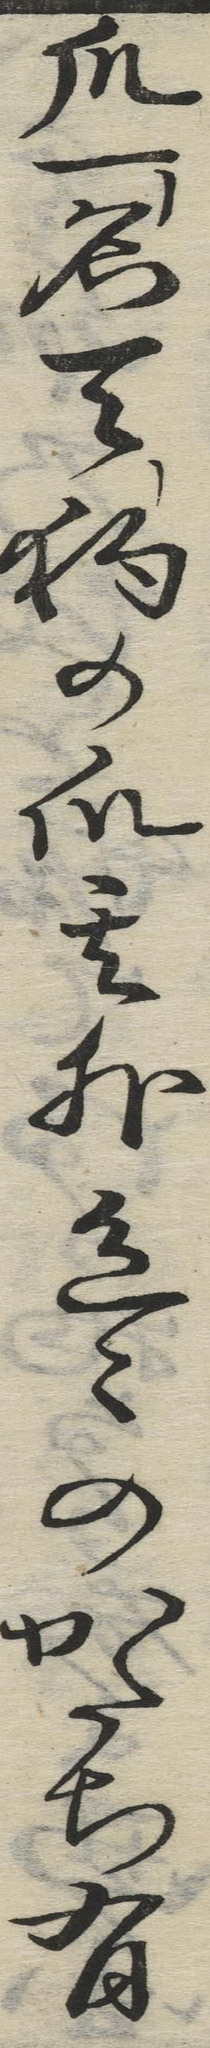爪一ノ名天狗の爪其外色々のかたち有
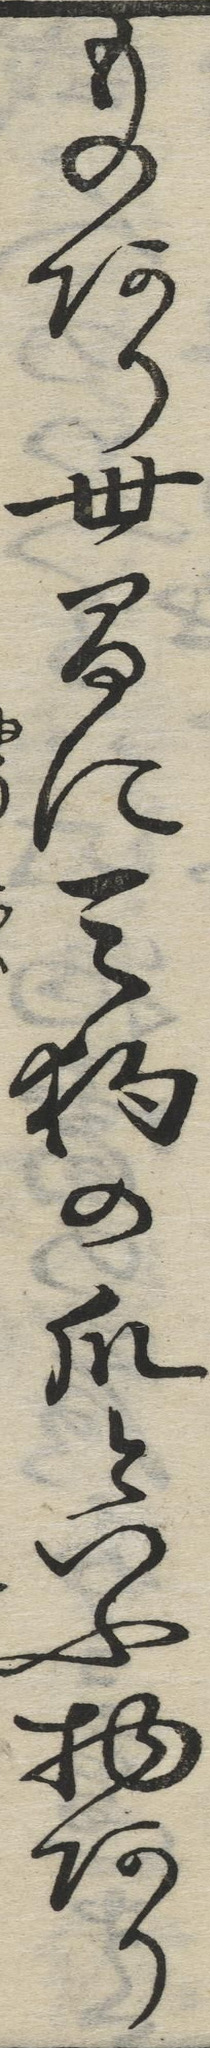ものあり世間に天狗の爪といふ物あり
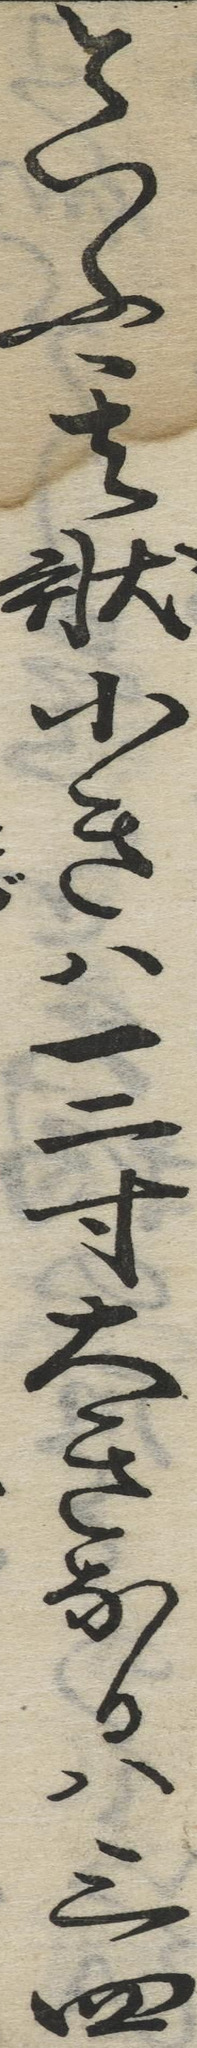といふ其状小きハ一二寸大きなるハ三四

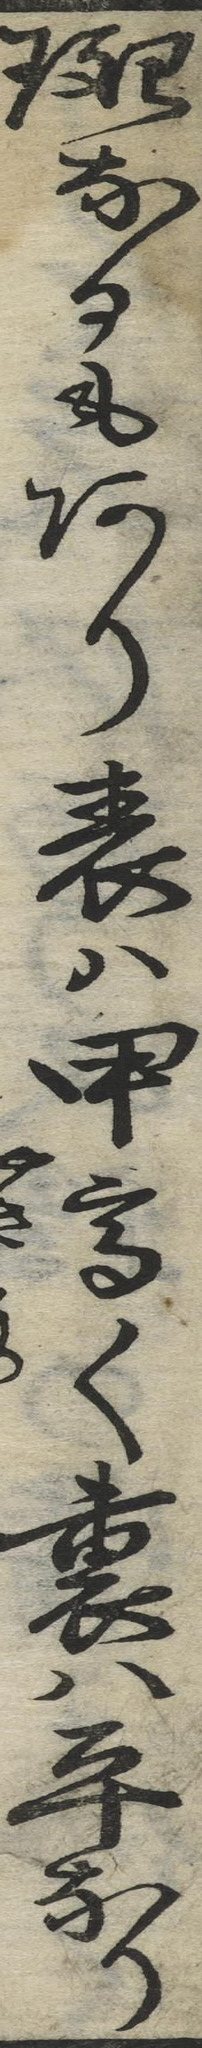斑なるもあり表ハ甲高〳〵裏ハ平なり
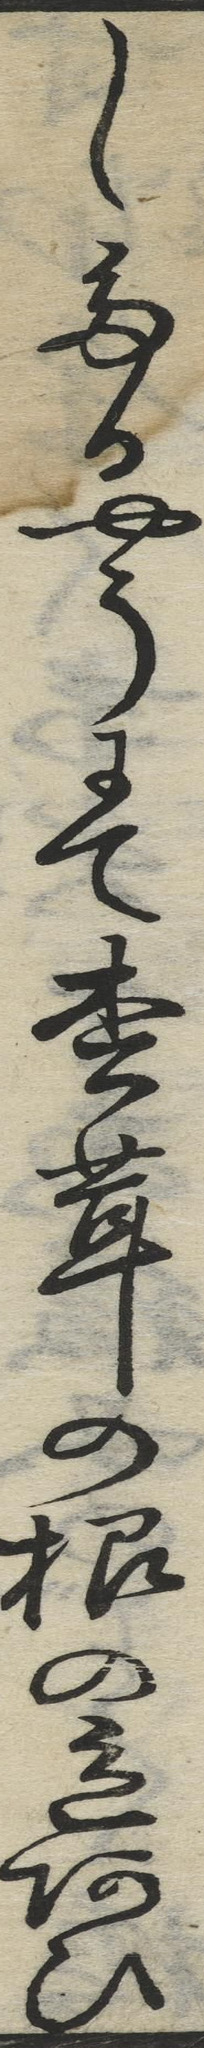したるやうにて杢茸の根の色あひ
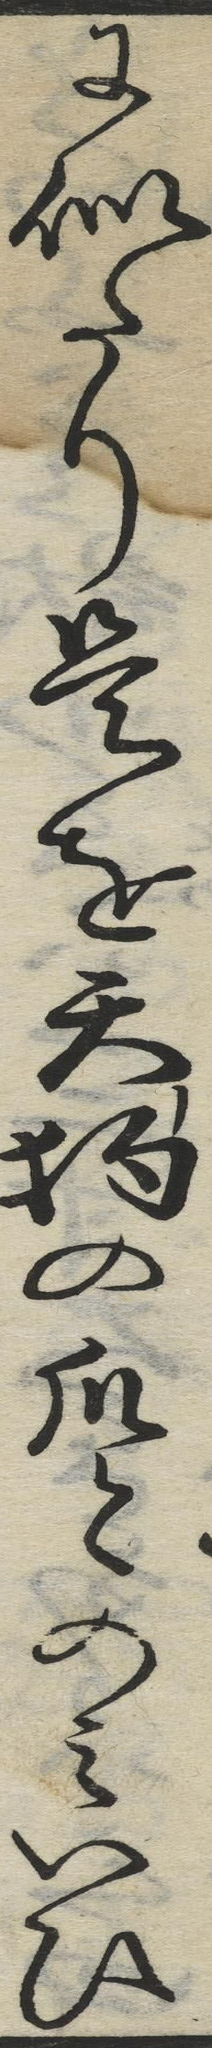に似たり是を天狗の爪とのミいひ
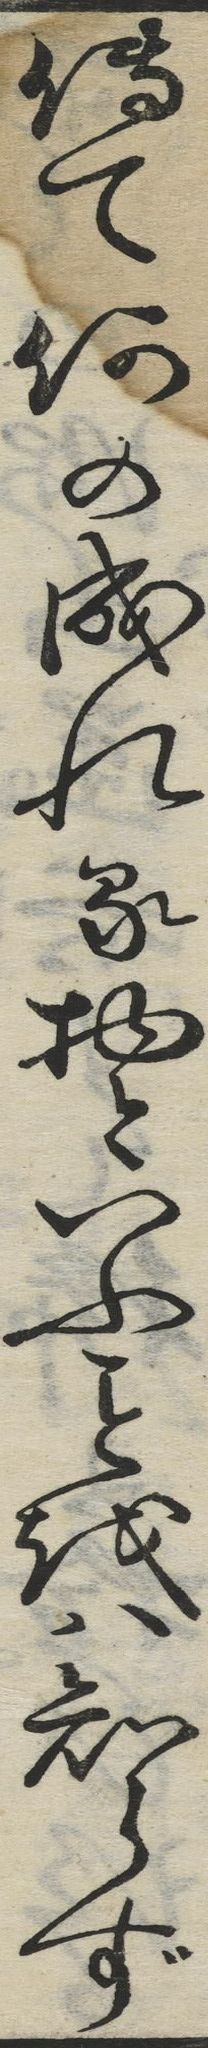伝て何の成れる物といふことをハ知らず
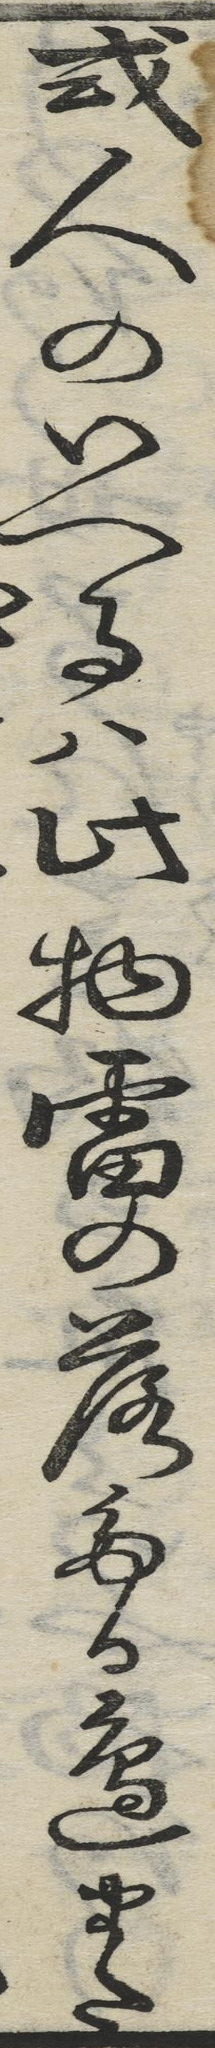或人のいへるハ此物雷の落たる辺また
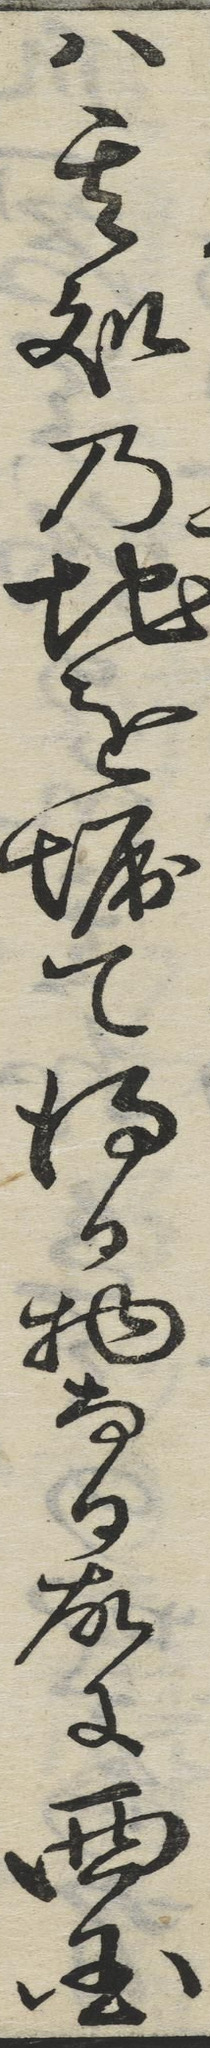ハ其処の地を掘て得る物なる故に西国
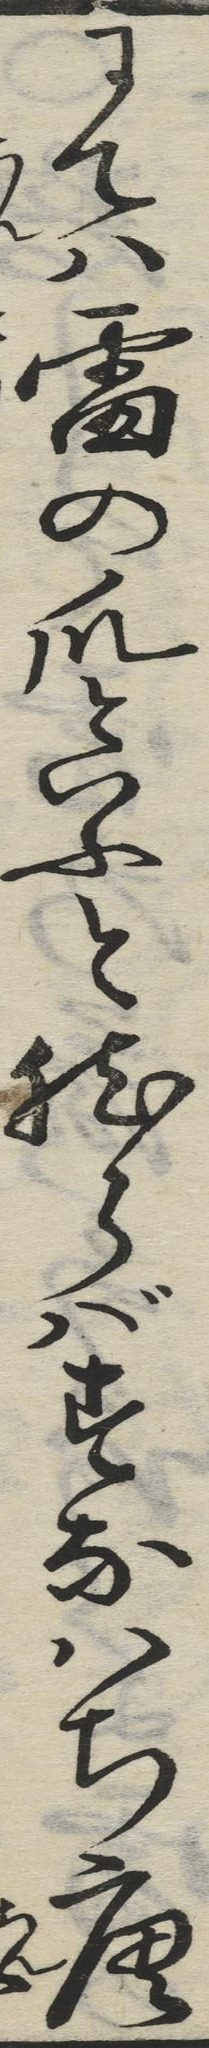にてハ雷の爪といふと然らバすなハち唐
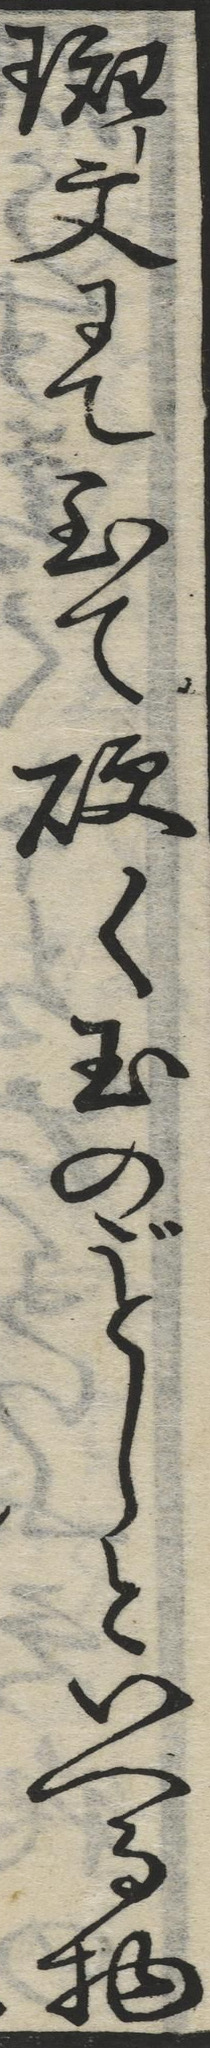斑文にて至て硬く玉のごとしといへる物
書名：雷震記　完
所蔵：東京大学地震研究所図書室 Earthquake Research Institute Library, The University of Tokyo, JAPAN
